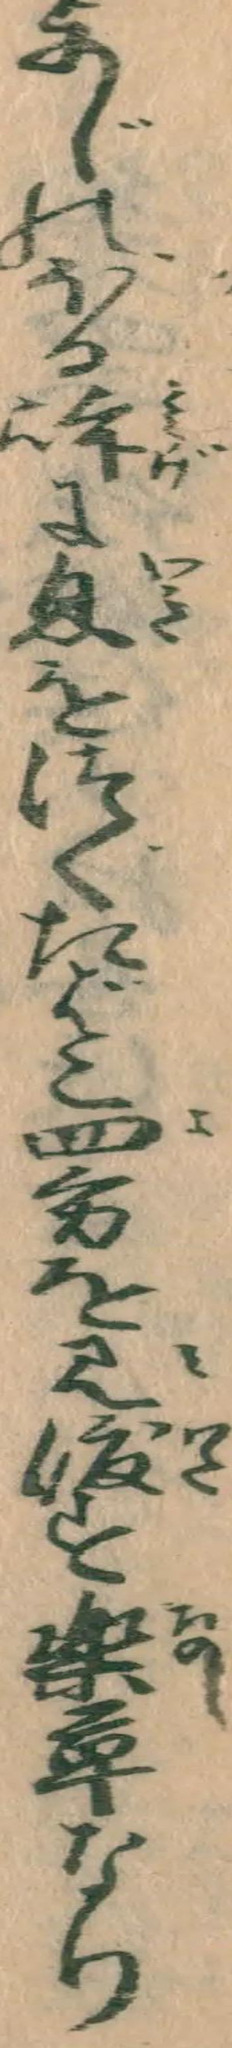よじのぼる峠に息をつくたばこ四方を見渡す楽草なり
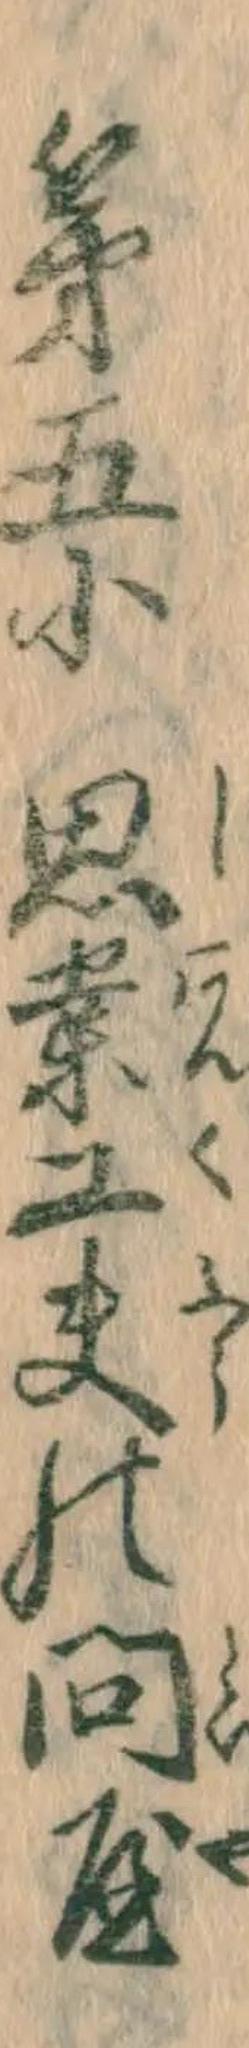第五に思案工夫の問屋
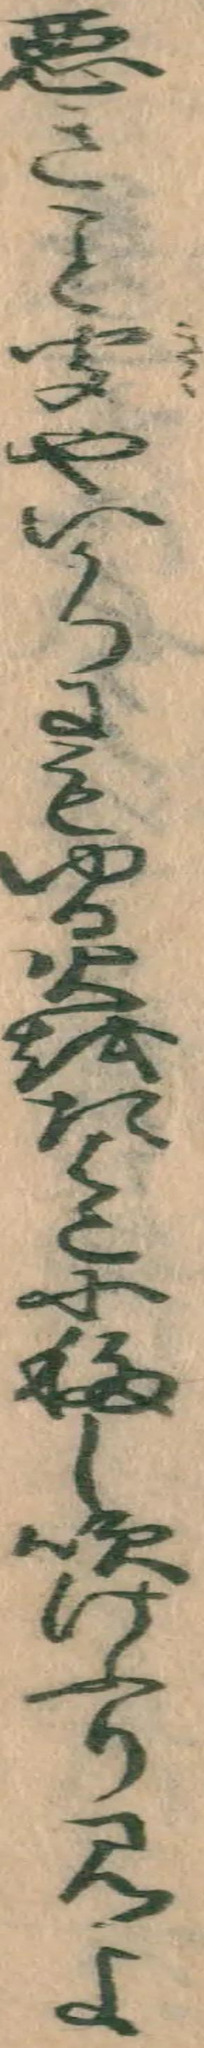悪きこと聞やいかりにもゆる火をたはこに移し吹けふり見よ
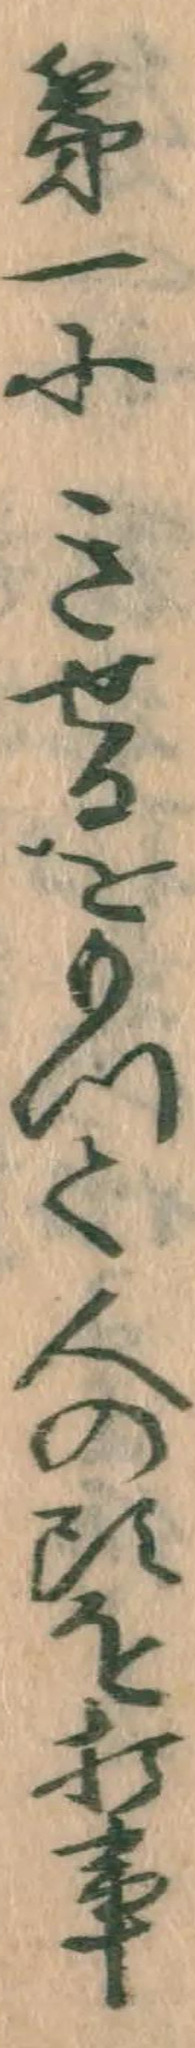第一にきせるをもつて人の頭を打事
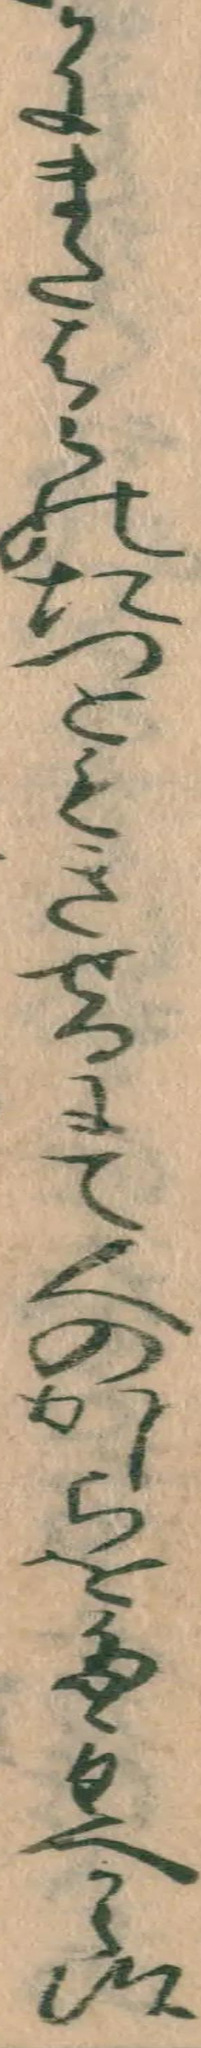いかにまたはらのたつともきせるにて人のかしらをたゝくへからす
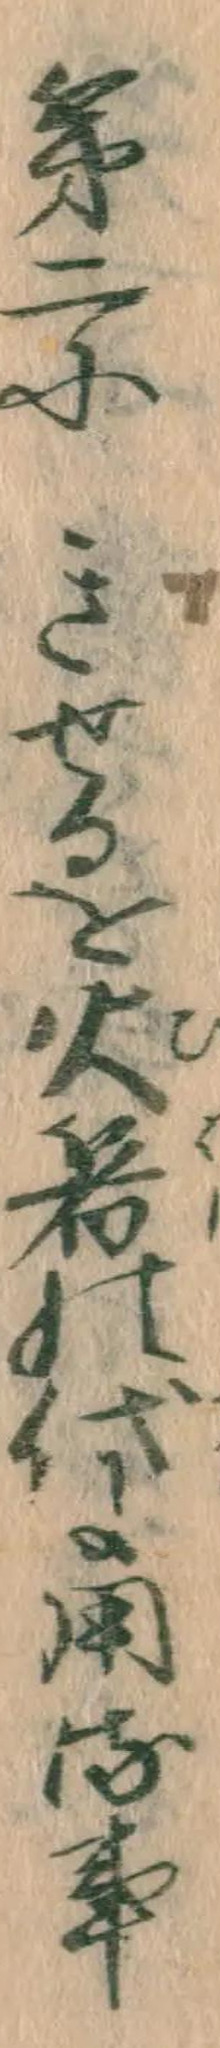第二にきせるを火箸の代に用る事
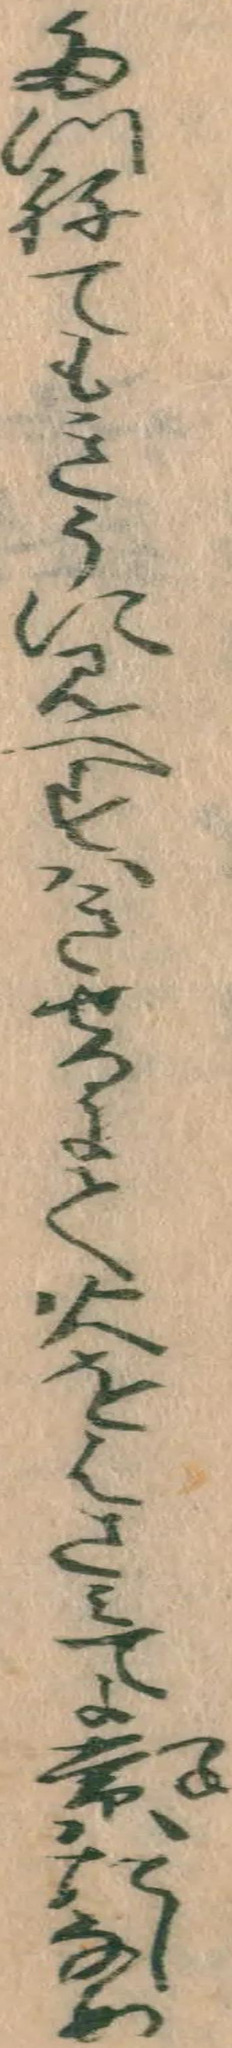たつねてもきうに見へすはきせるにて火をはさみてに常はたしなめ
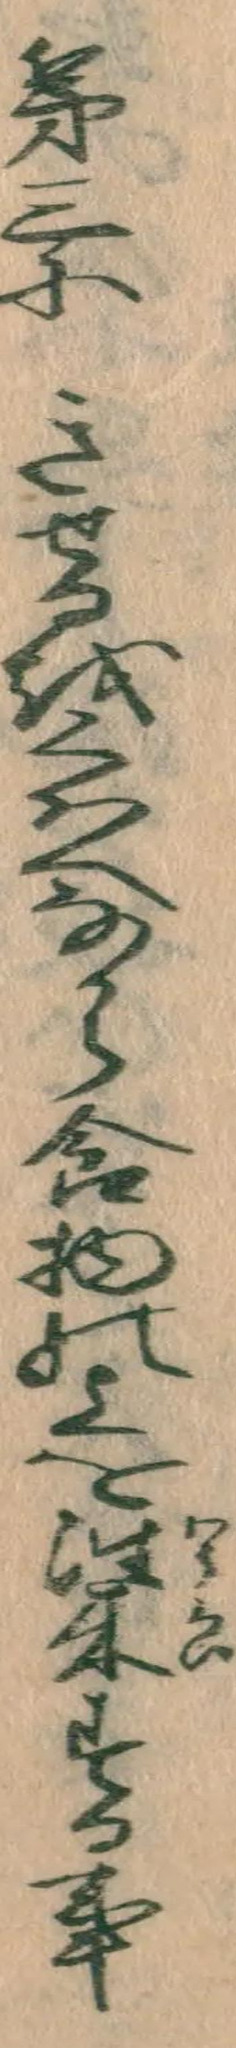第三にきせるをくはへなから食物の上を往来する事
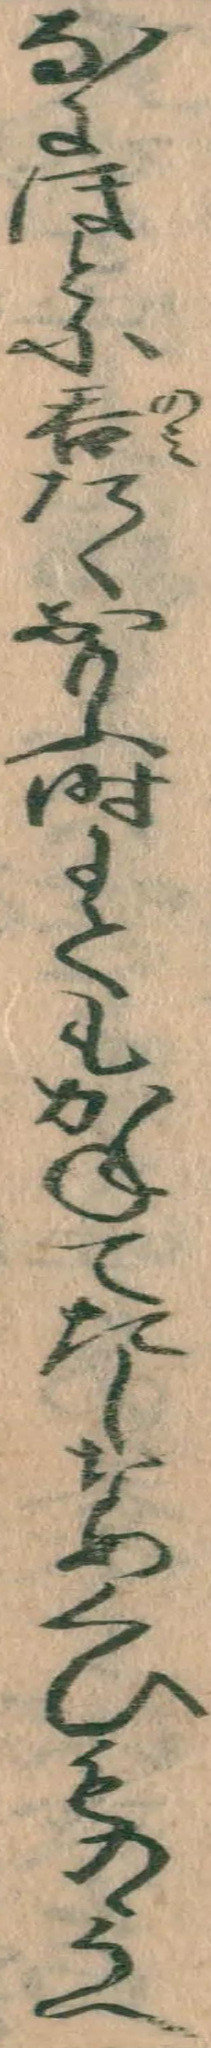なにほとに呑たくおもふ時にてもかねてたしなめくひものゝうへ
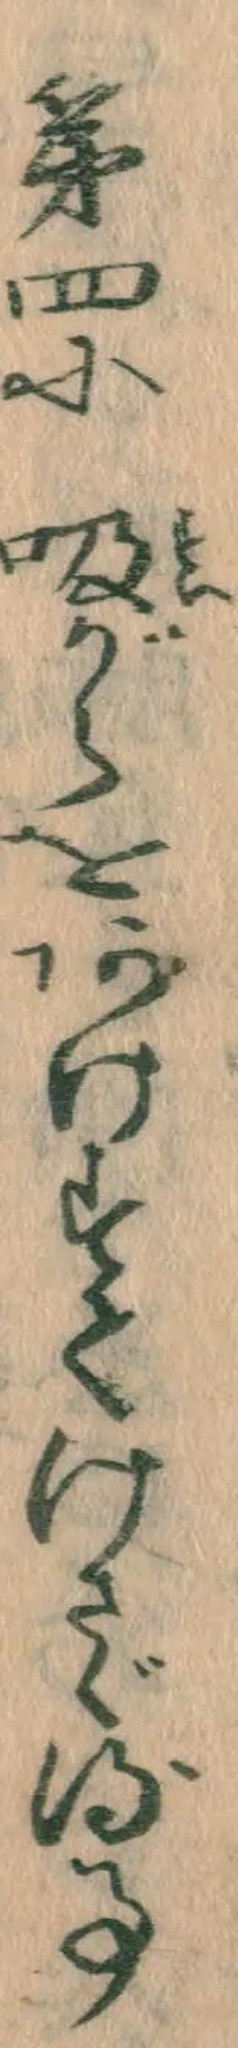第四に吸がらをあけすてけさゞる事
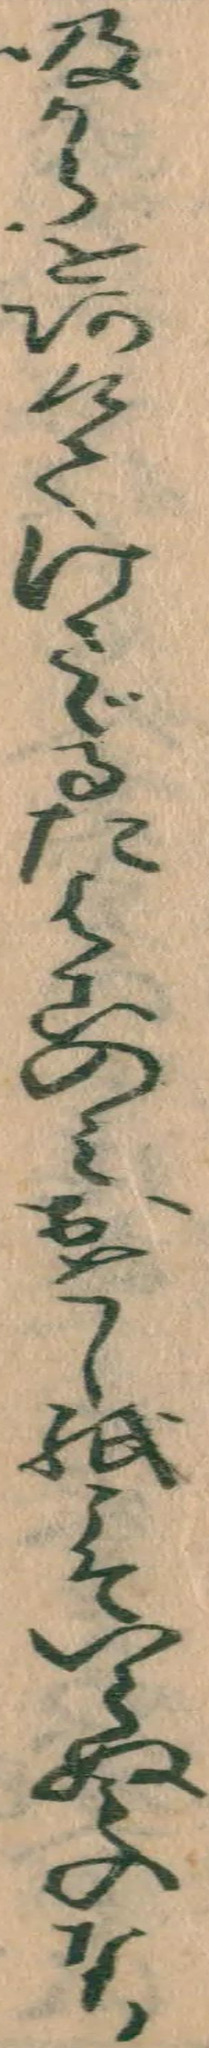吸からをあけてけさゞるたはこのみおとし紙にていらぬものなり
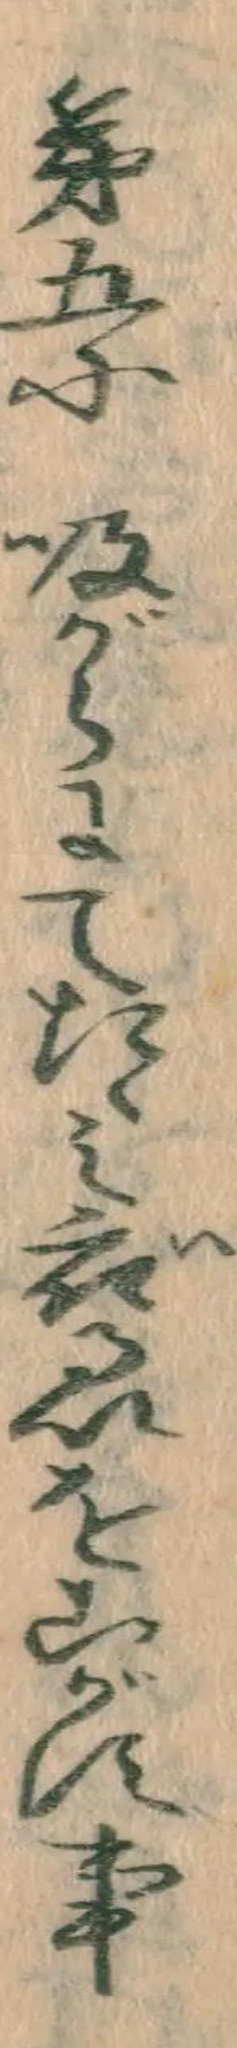第五に吸がらにてたゝみ衣るいをこがす事
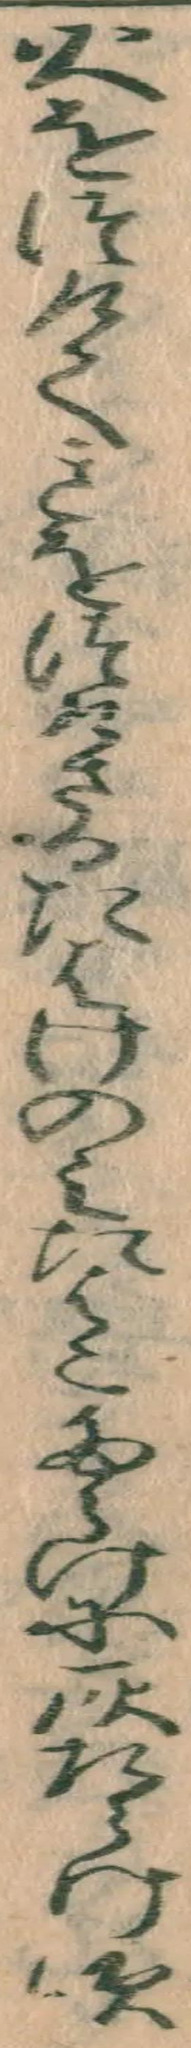火をつけてきをつけさるたはこのみたはこたらけに灰たらけ吹
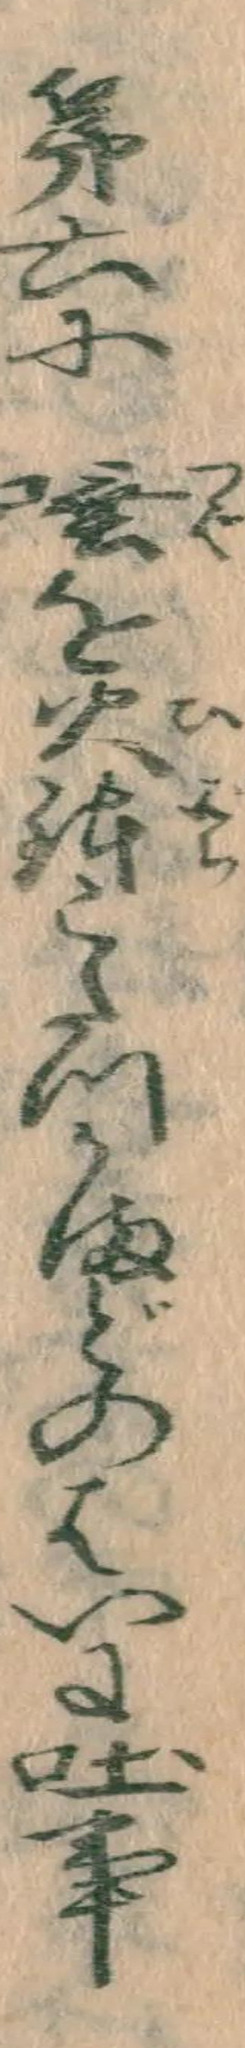第六に唾を火鉢こたつかまどのはいに吐事
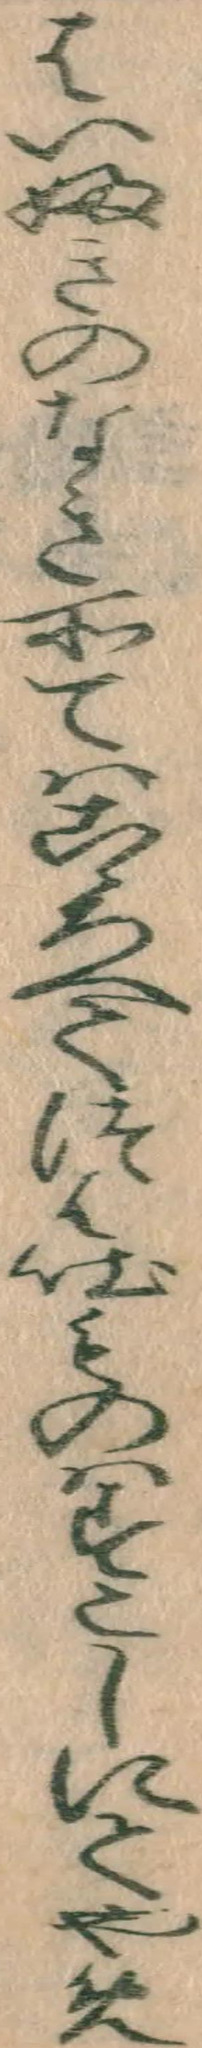はいふきのなき所てはこゝろへてつは吐ものはすこしにてやめ
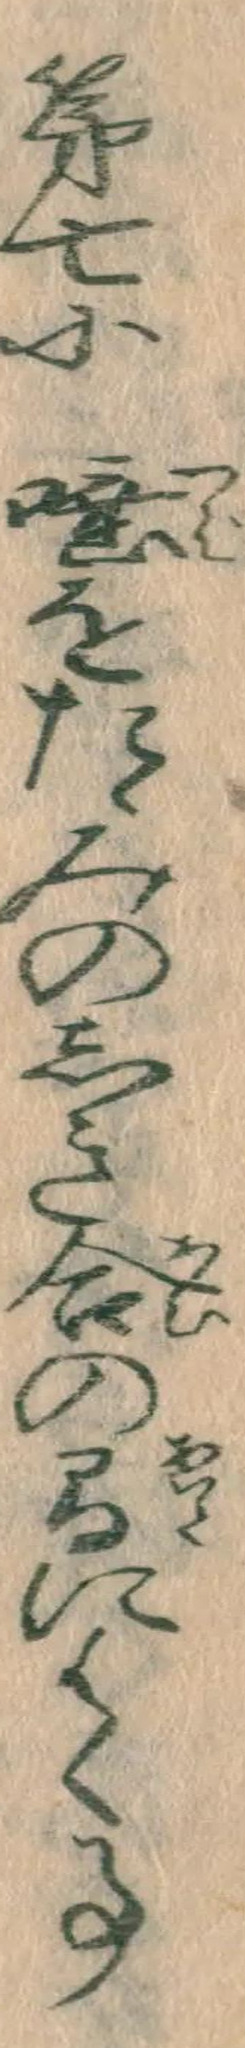第七に唾をたゝみのしき合の間にはく事
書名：煙草記
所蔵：国立国会図書館 National Diet Library, JAPAN
